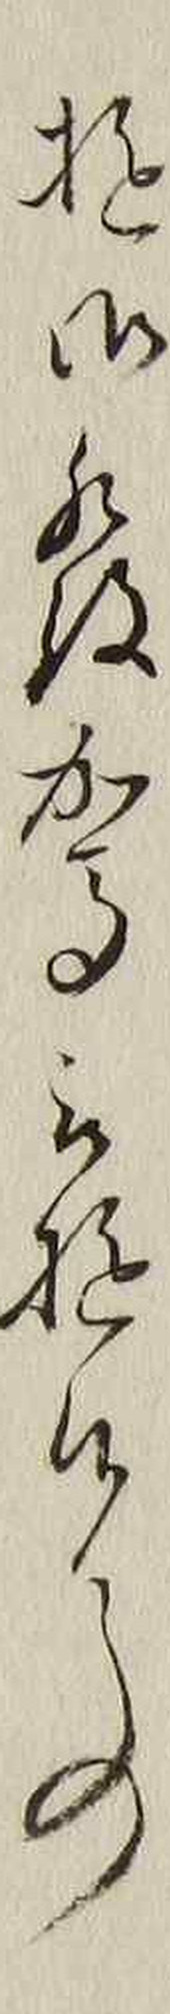遊御発駕被遊候事
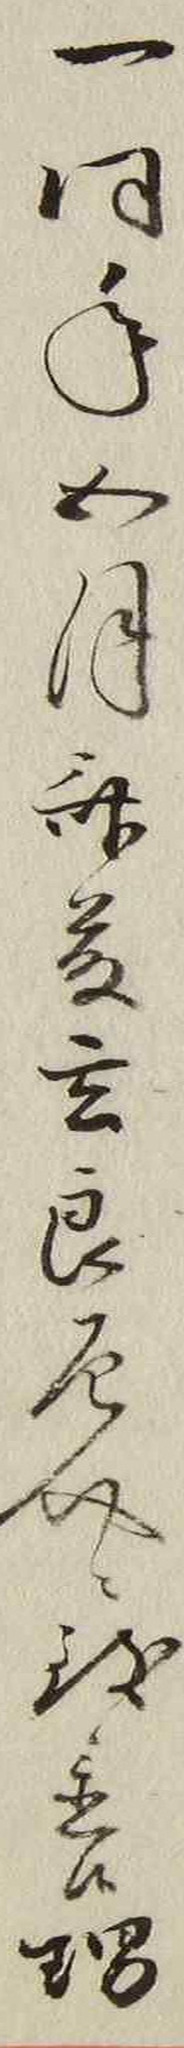一同年五月斎藤玄良厄介ニ致置候甥
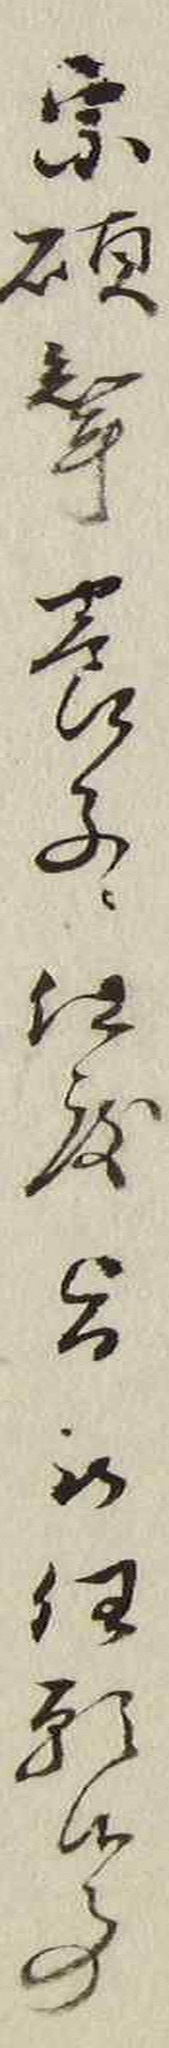宗硯聟養子ニ仕度旨被任願候事
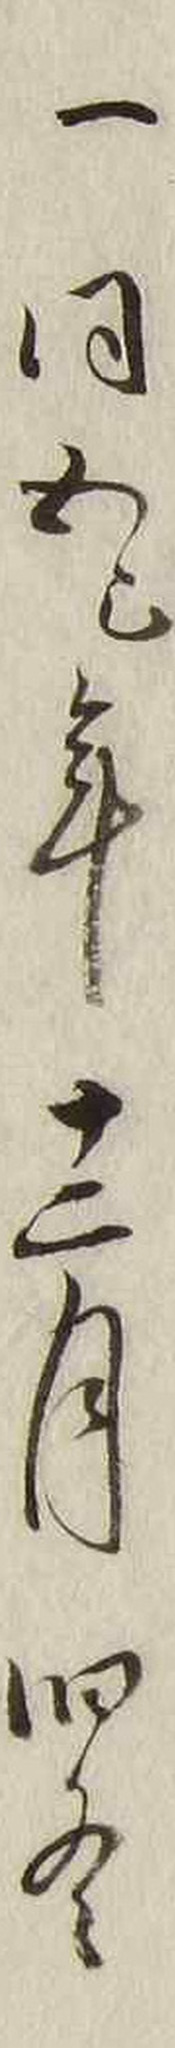一同五巳年十二月旧冬

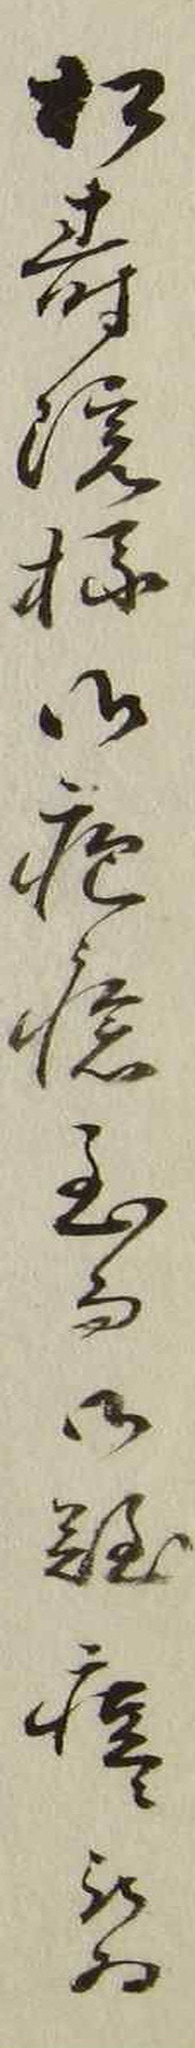松寿院様御疱瘡至而御難痘ニ被為
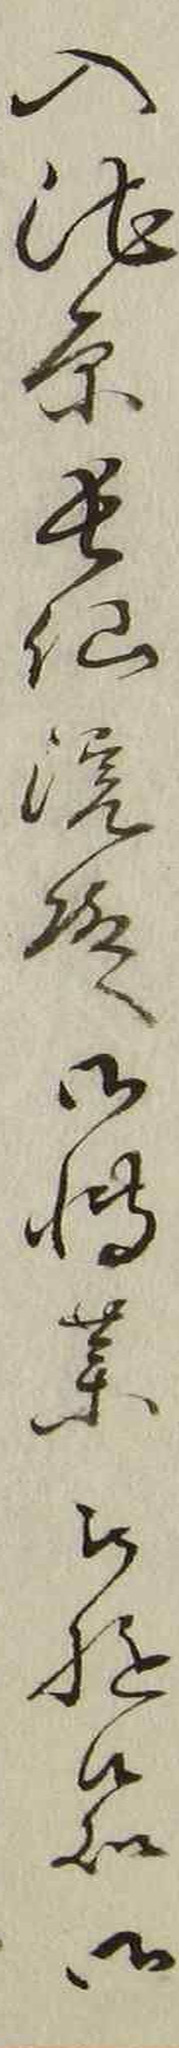入池原長仙院殿へ御転薬被遊候処御
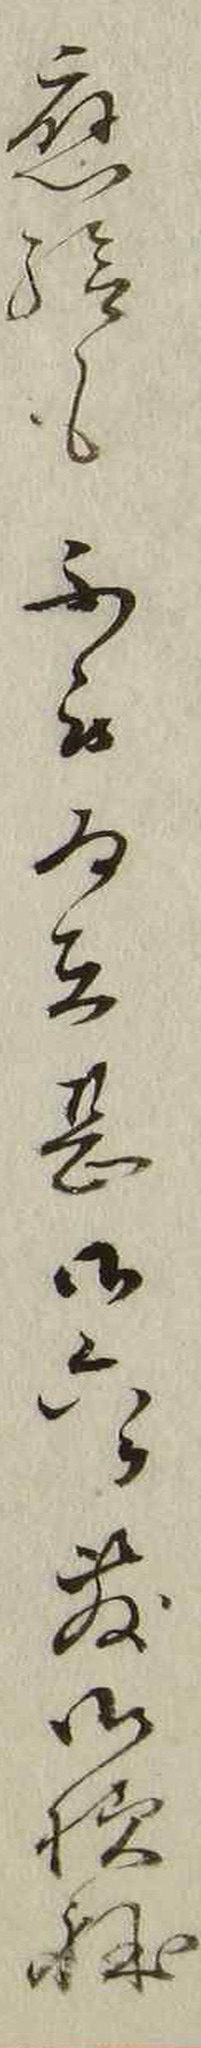応給も不被為在甚御六ケ敷御様体
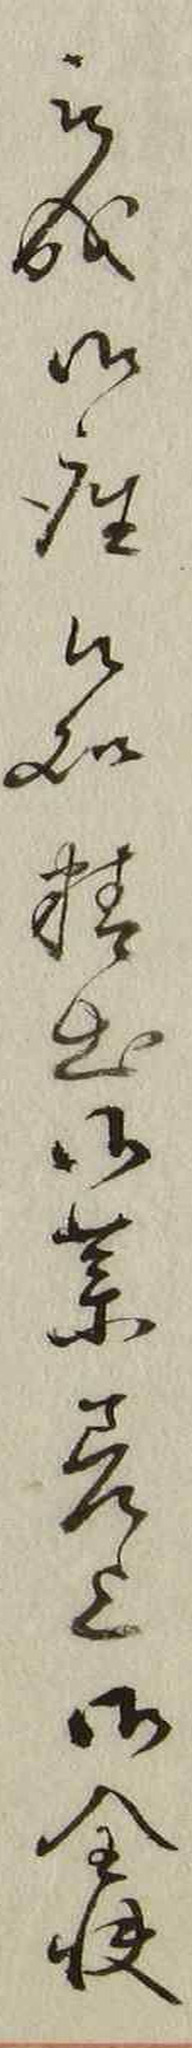被成御座候処精出御薬差上御全快
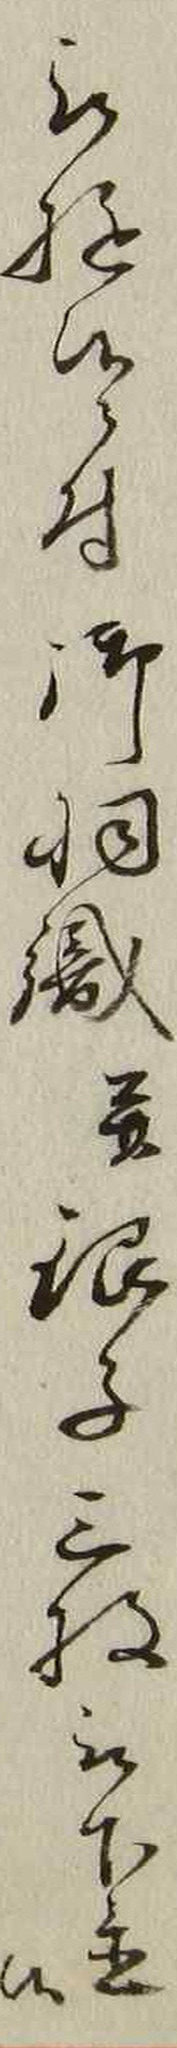被遊候ニ付御羽織并銀子三枚被下置候
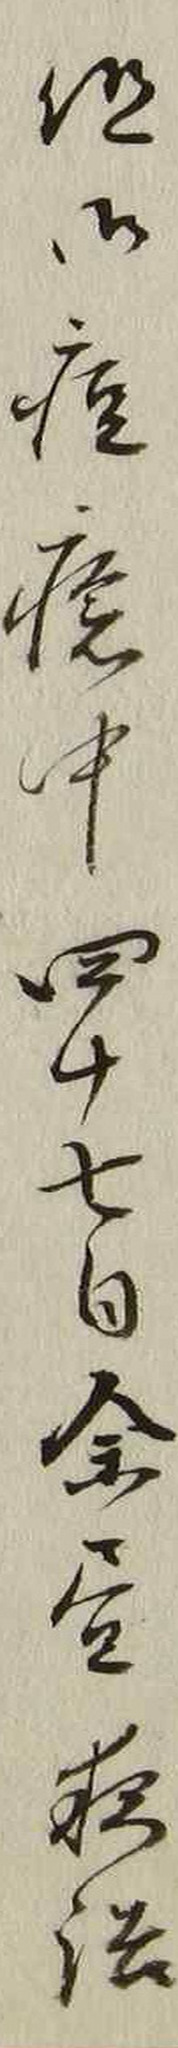但御痘瘡中四十七日余昼夜詰
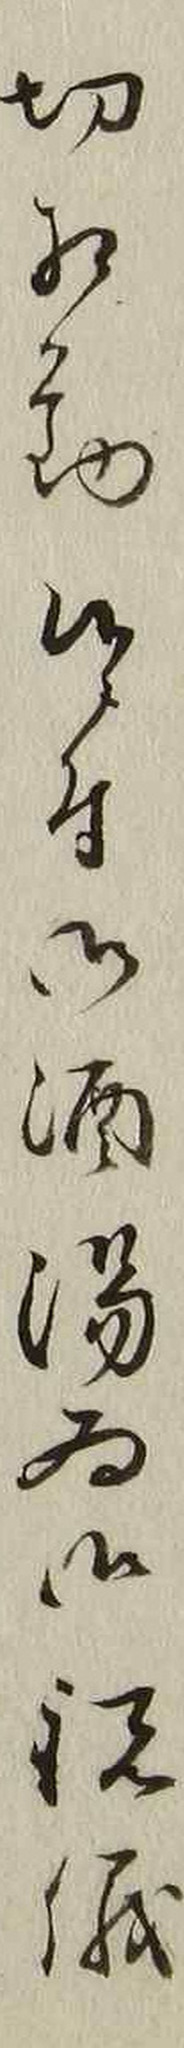切相勤候ニ付御酒湯為御祝儀
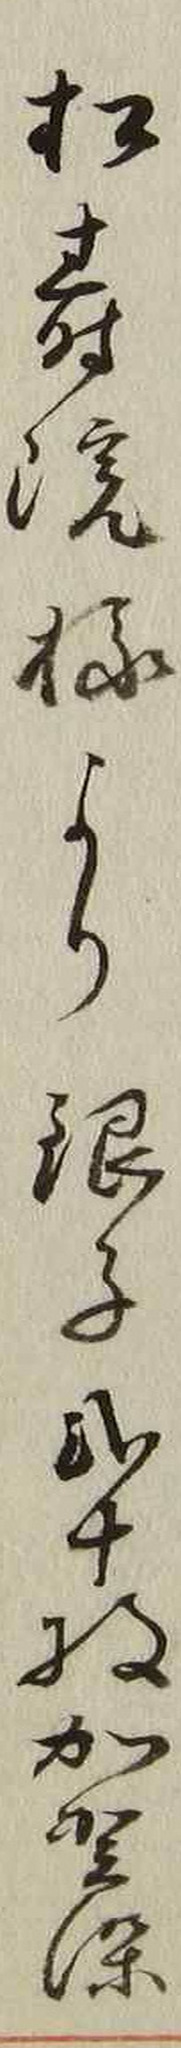松寿院様より銀子弐十枚加賀染
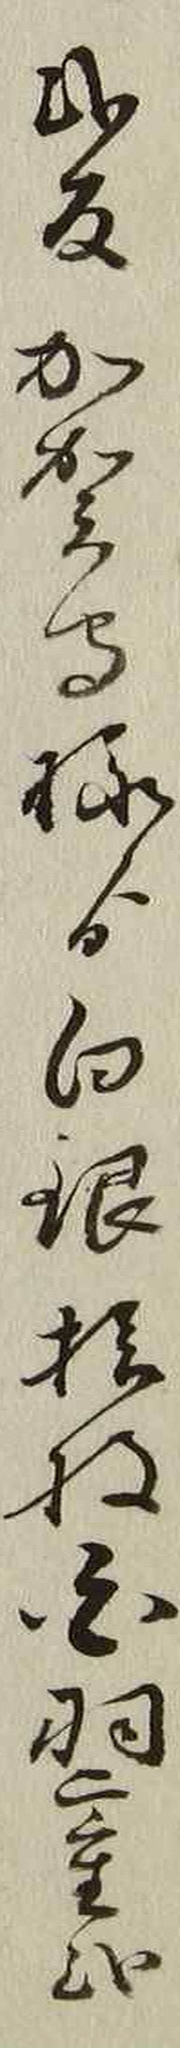弐反加賀守様より白銀拾枚白羽二重弐
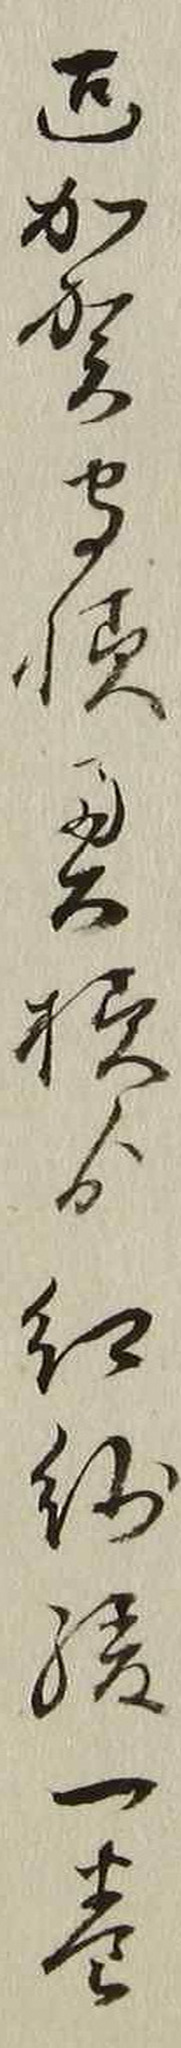匹加賀守様奥様より紅紗綾一巻
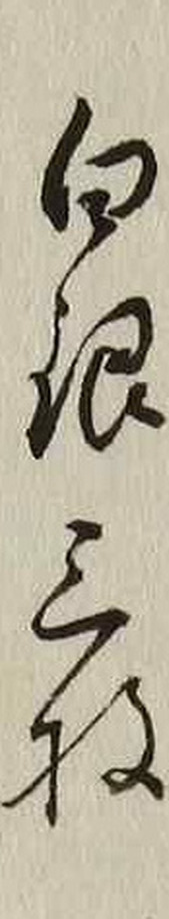白銀三枚
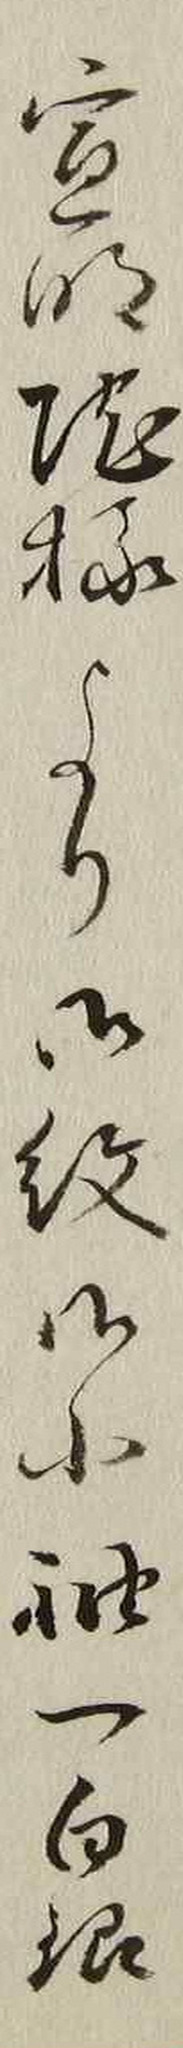宣明院様より御紋御小袖一白銀
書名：諸士系譜　巻之8　い之部8
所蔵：会津若松市立会津図書館
